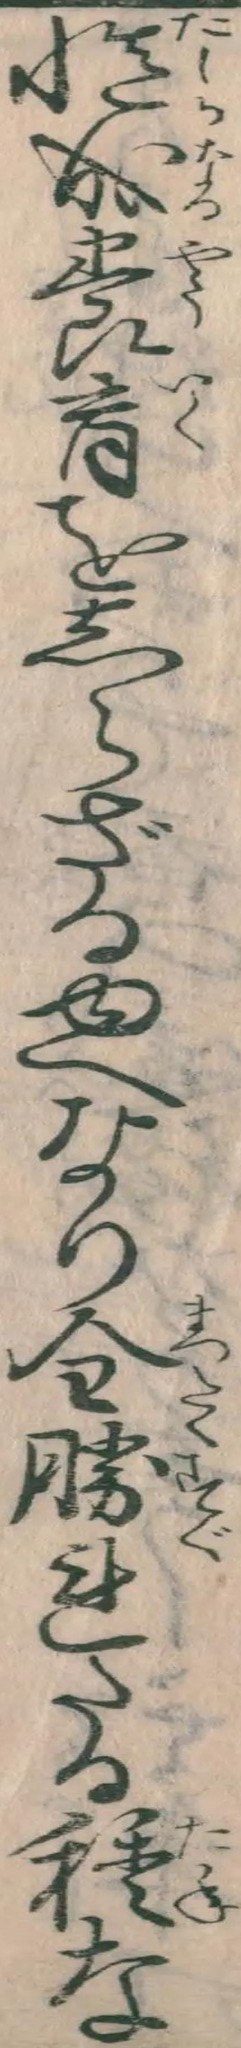慥成養育をしらざるゆへなり全勝れたる種な
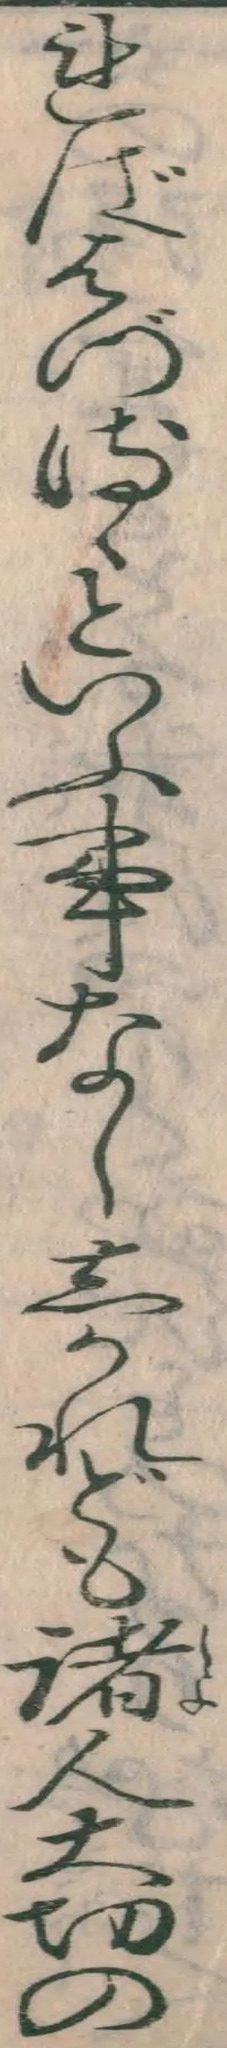ればはづるゝといふ事なししかれども諸人大切の
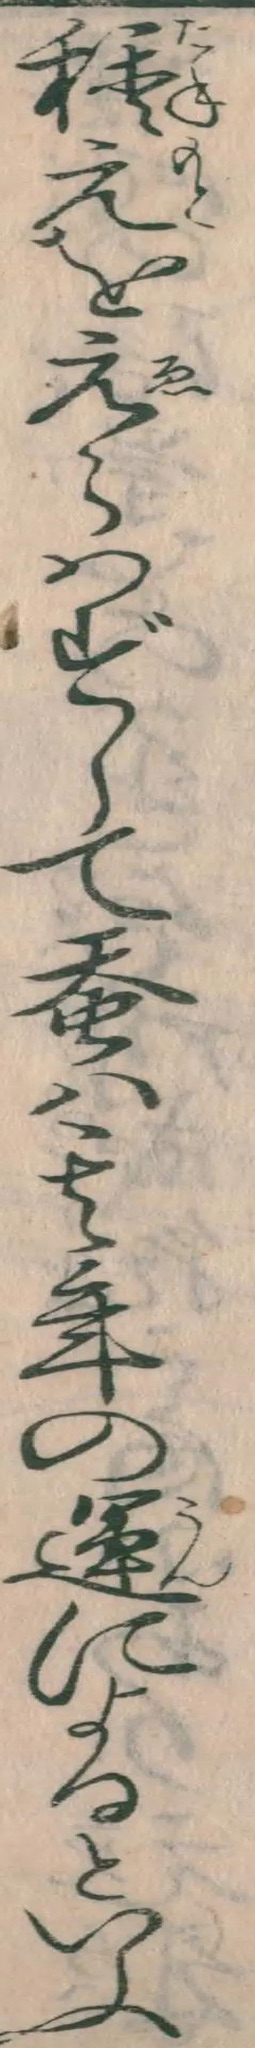種元をえらはずして蚕は其年の運によるといふ
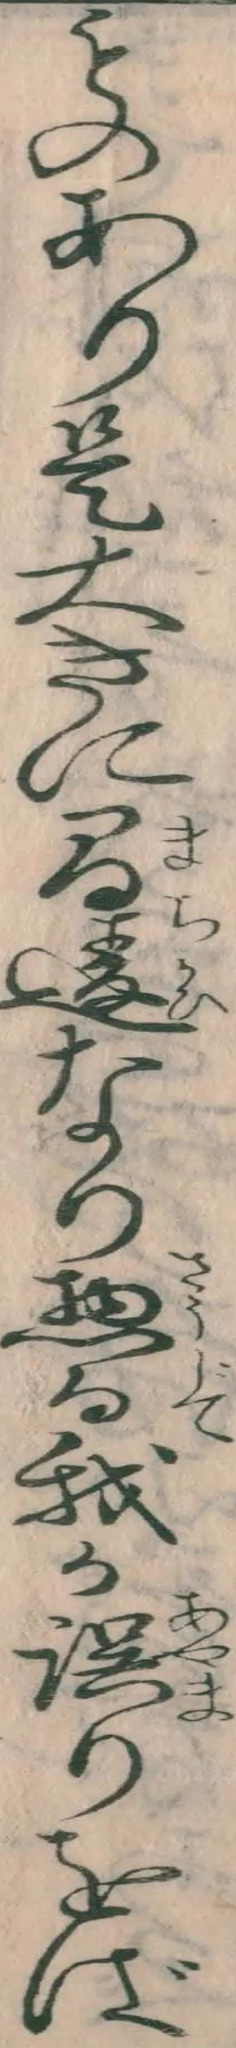ものあり是大きに間違なり惣而我か誤りをば
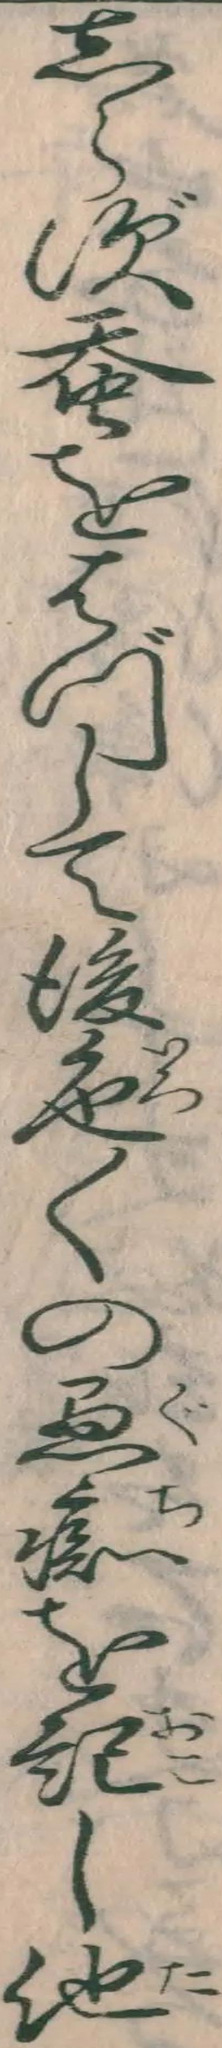しらず蚕をはづして後色〳〵の愚痴を起し他
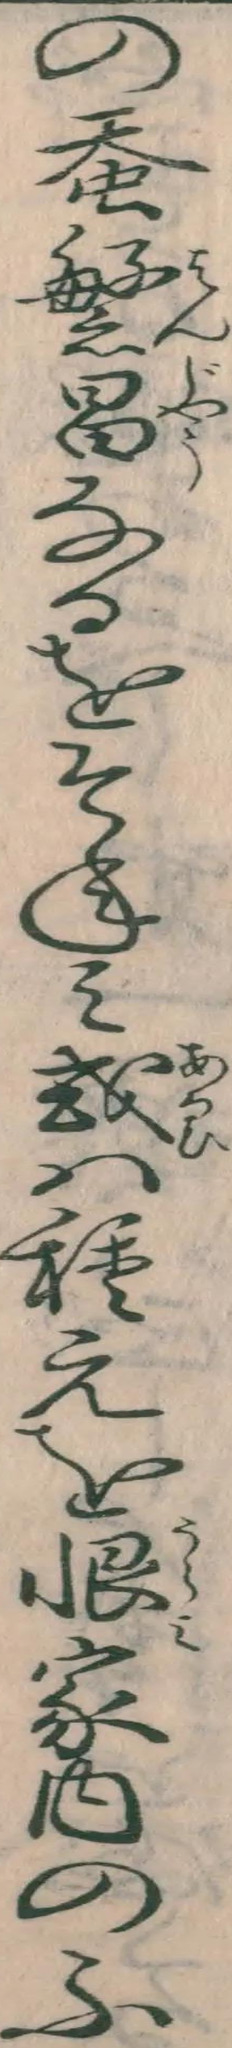の蚕繁昌なるをそねみ或は種元を恨家内の不
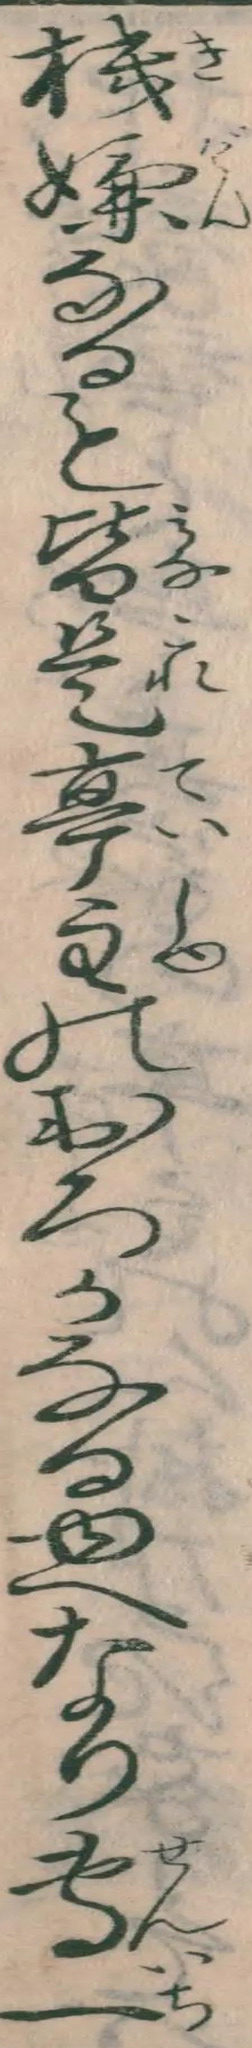機嫌なるも皆是亭主のおろかなるゆへなり専一
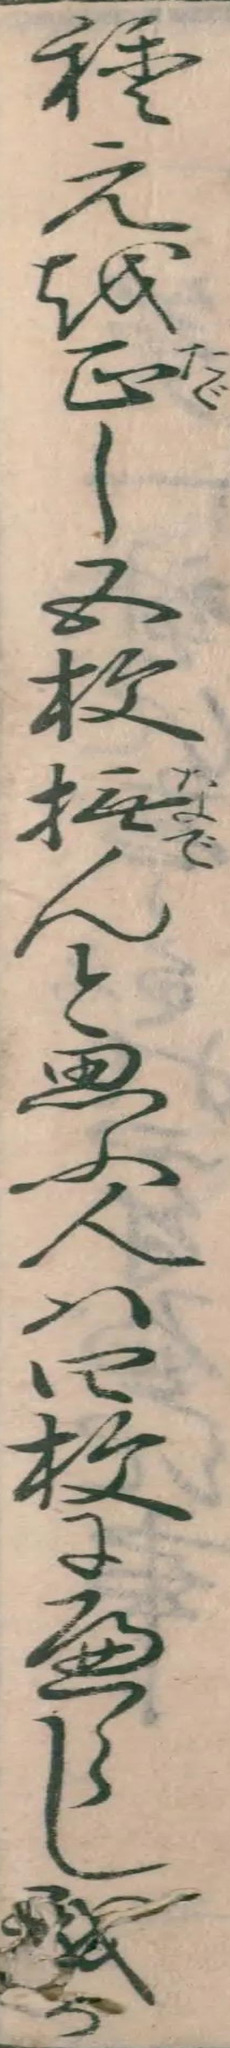種元を正し五枚撫んと思ふ人は四枚にへらし我が
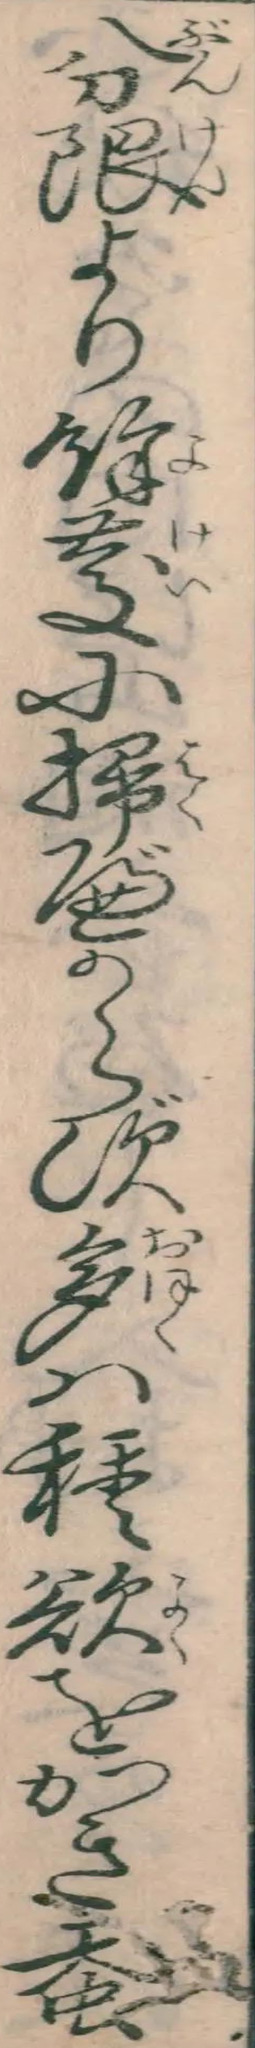分限より余慶に掃べからず多は種欲をかき蚕
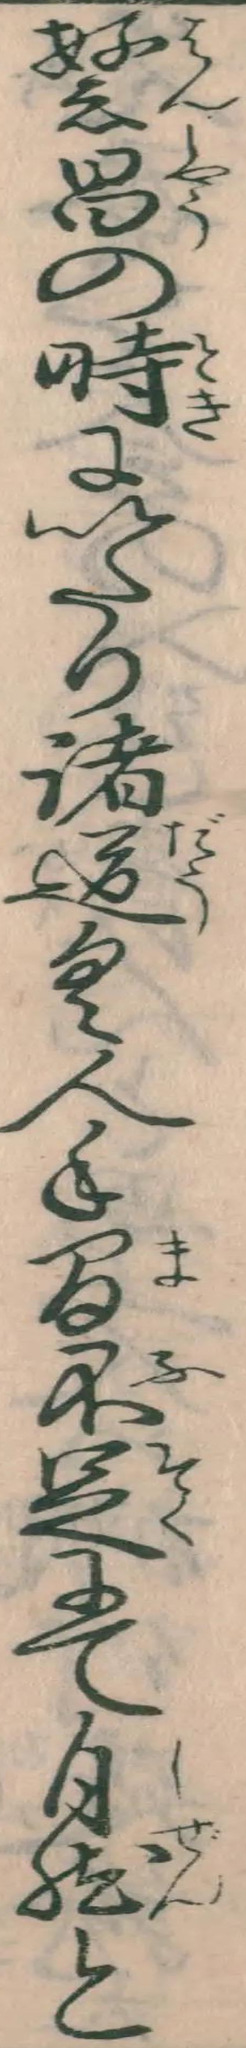繁昌の時にいたり諸道具人手間不足にて自然と
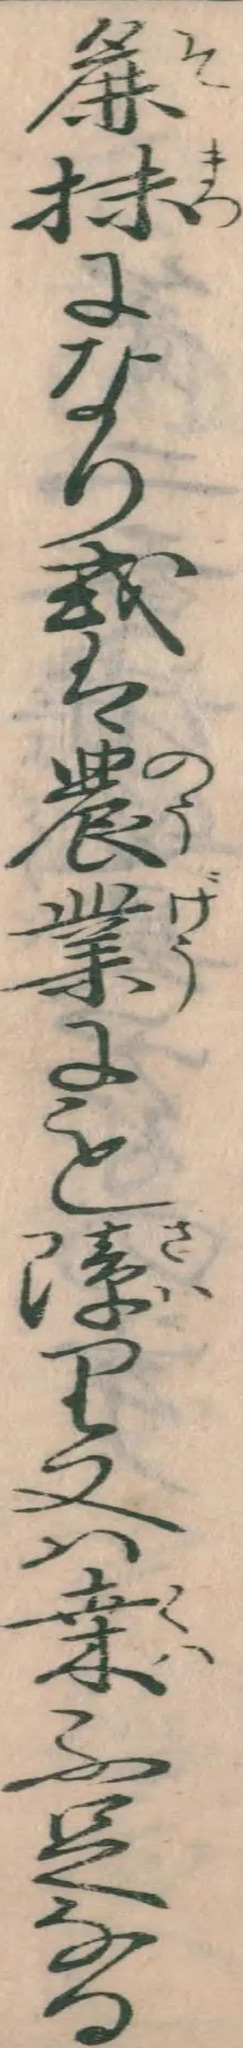麤抹になり或は農業にも障り又は桑不足なる
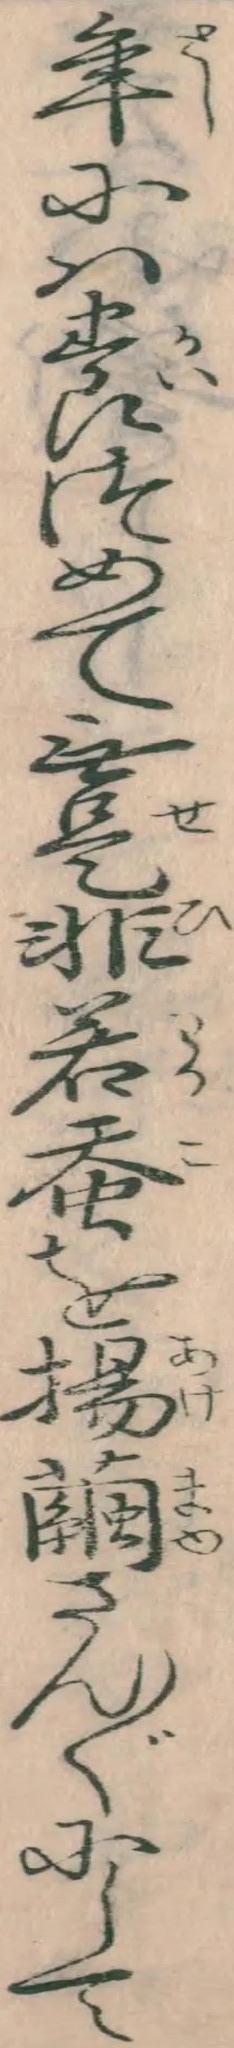年には養つめて無是非若蚕を揚繭さん〴〵にして
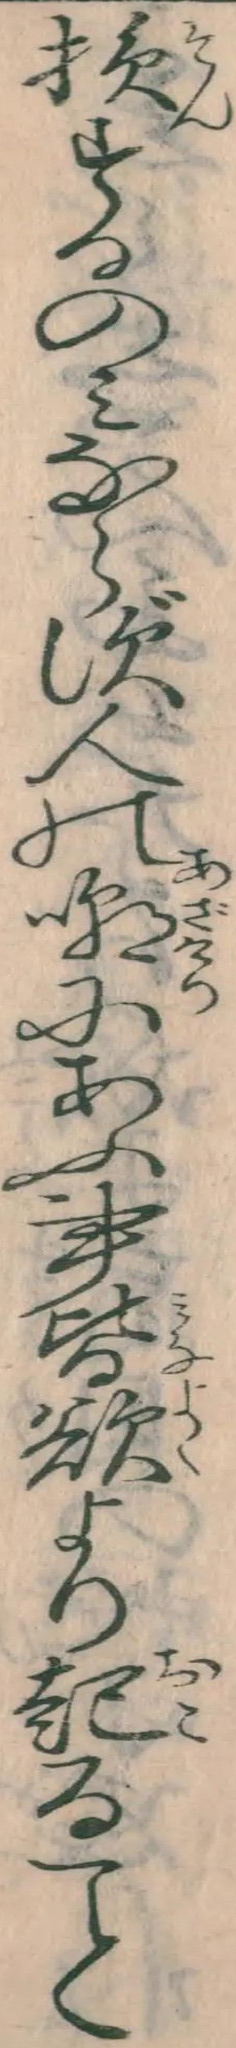損するのみならず人の嘲にあふ事皆欲より起ること
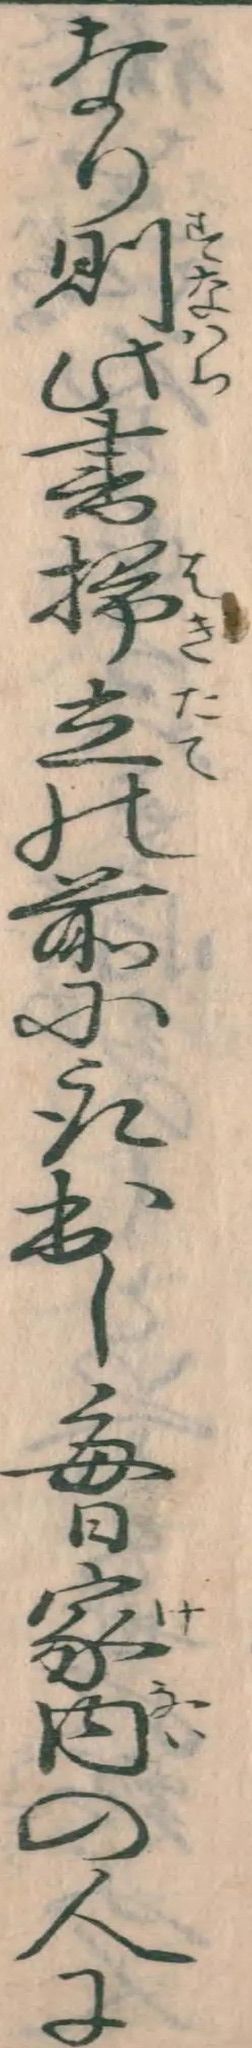なり則此書掃立の前に取出し毎日家内の人に
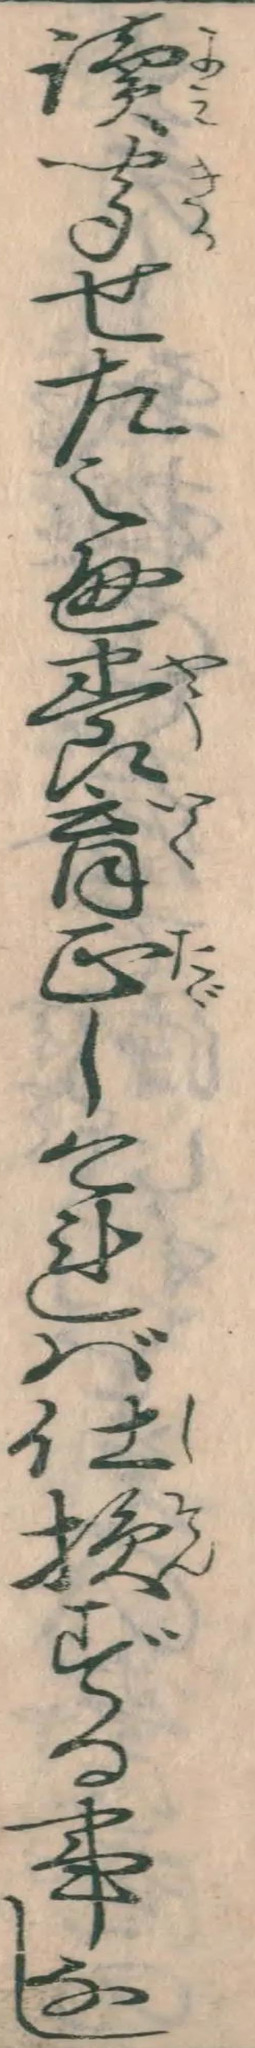読聞せ左之通養育正しければ仕損ずる事なし
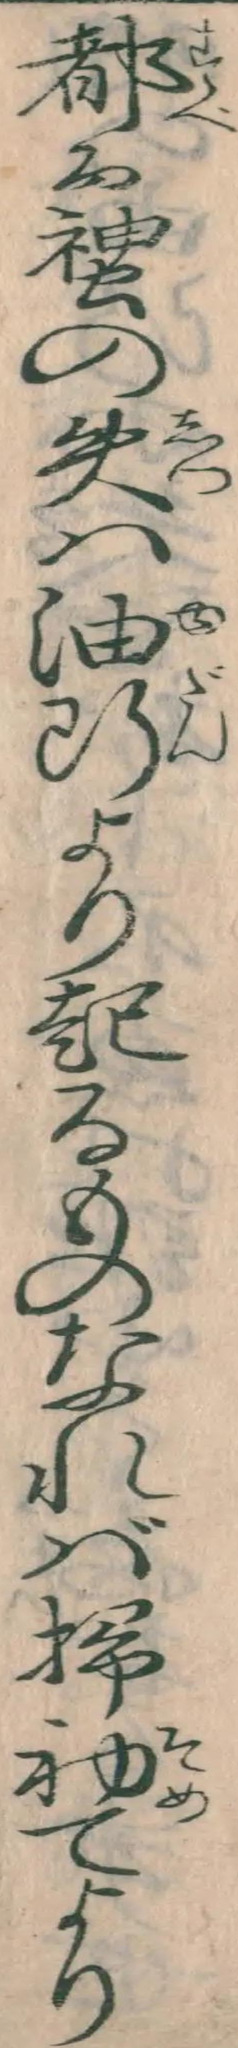都而䗝の失は油断より起るものなれば掃初てより
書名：新撰養蚕秘書
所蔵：国立国会図書館 National Diet Library, JAPAN
